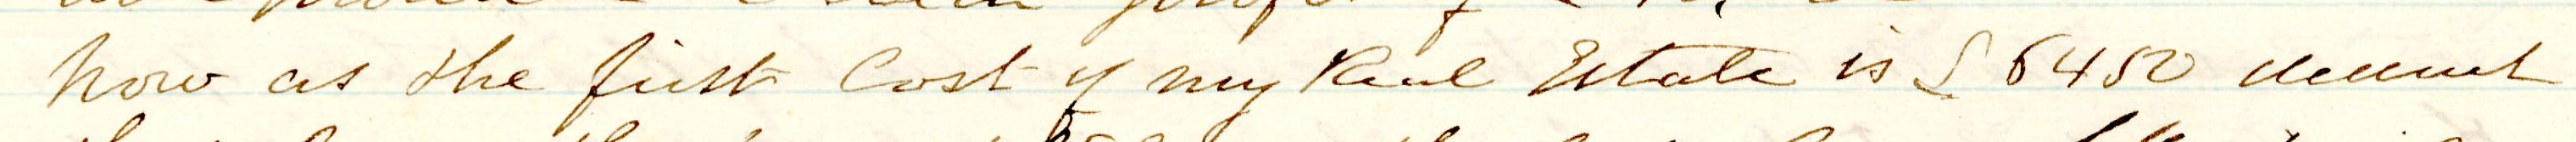now as the first cost of my Real Estate is £6450 account
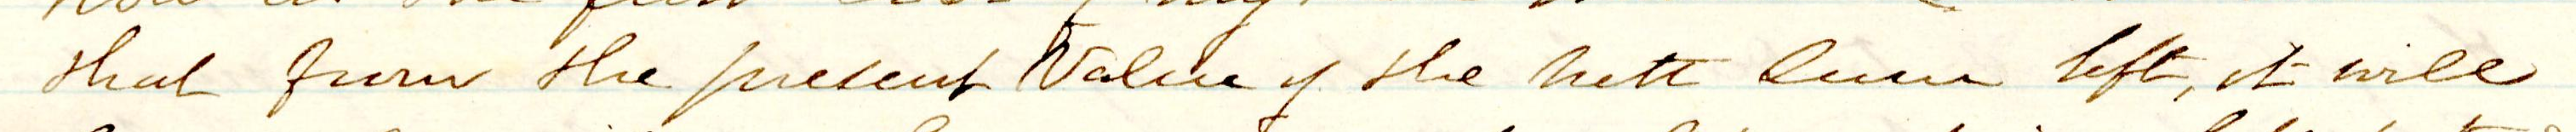that from the present Value of the nett sum left, it will
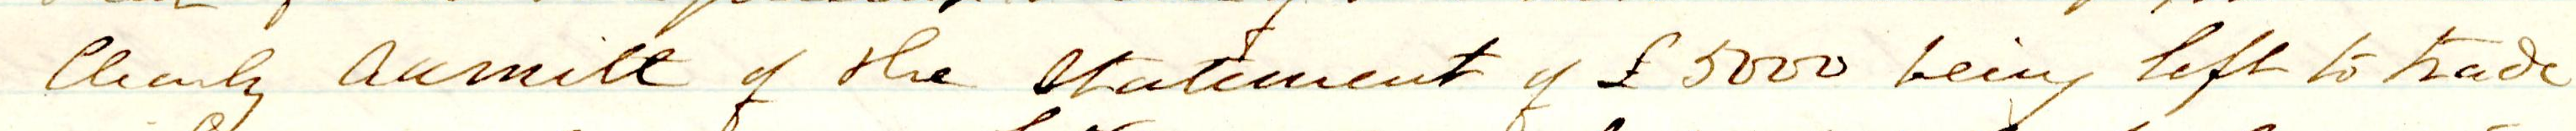Clearly sumitt of the statement of £5000 being left to trade
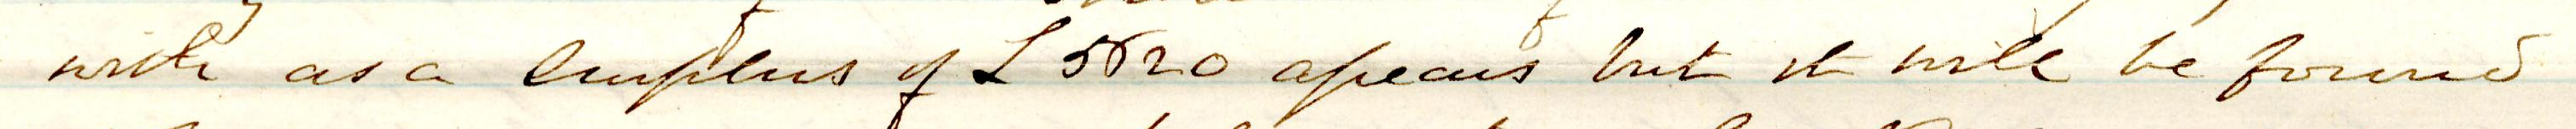with as a surplus of £5020 apears but it will be found
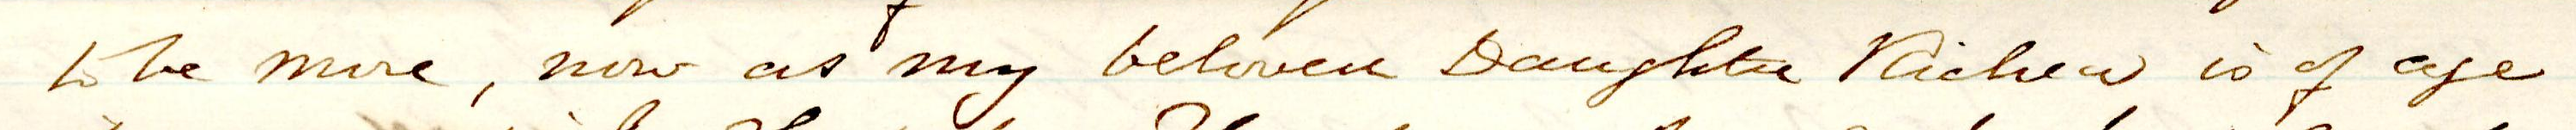to be more, now as my beloved Daughter Richea is of age
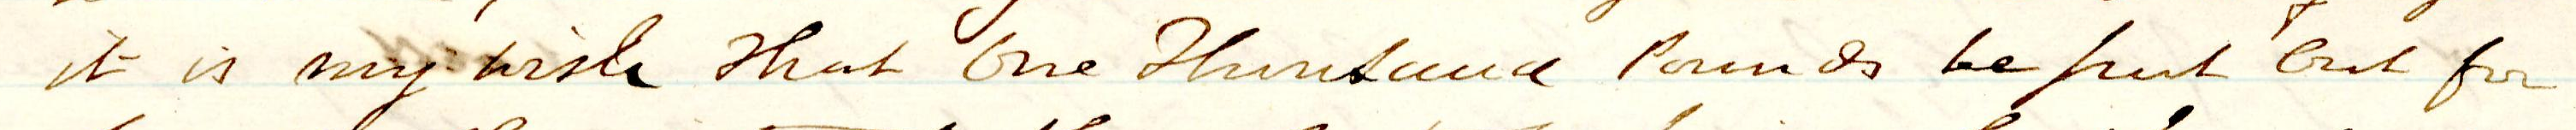it is my wish that one Hundred pounds be put out for
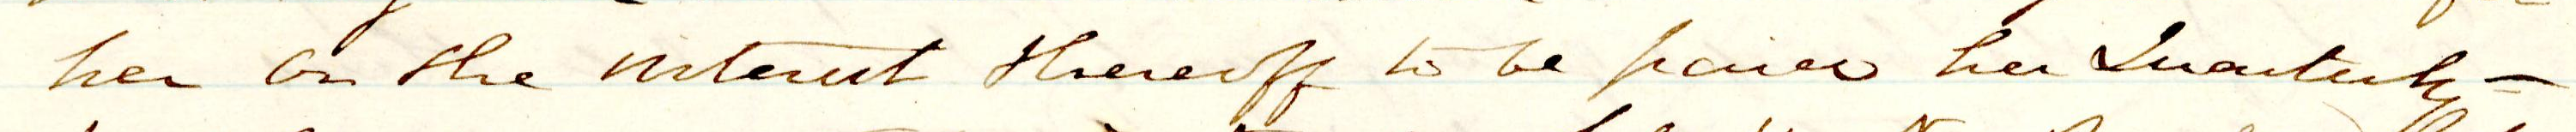her on the interest thereoff to be paid her Quarterly-
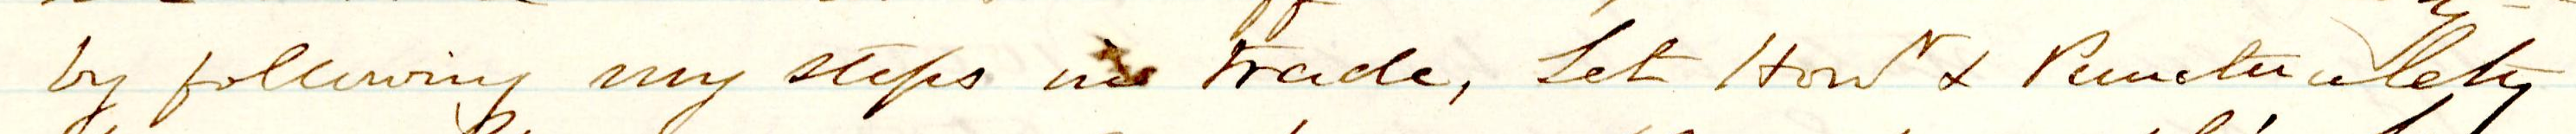by following my steps in trade, Let Hon^r & Punctualety
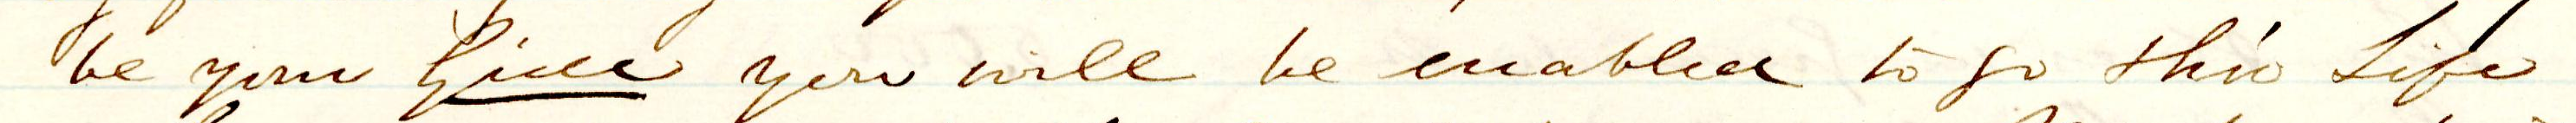be your Give you will be enabled to go this Life
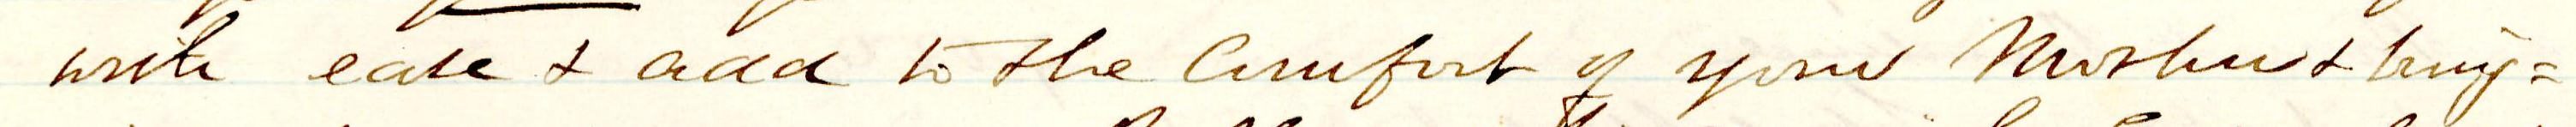with ease & add to the comfort of your merchent bring-
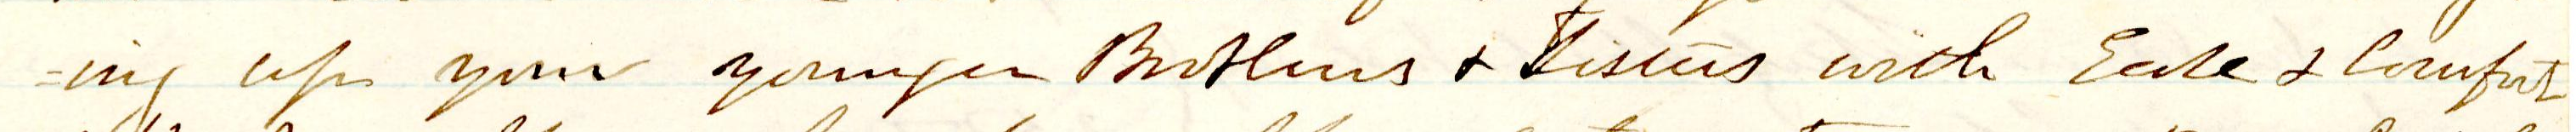-ing up your younger Brothers & sisters with Ease & Comfort
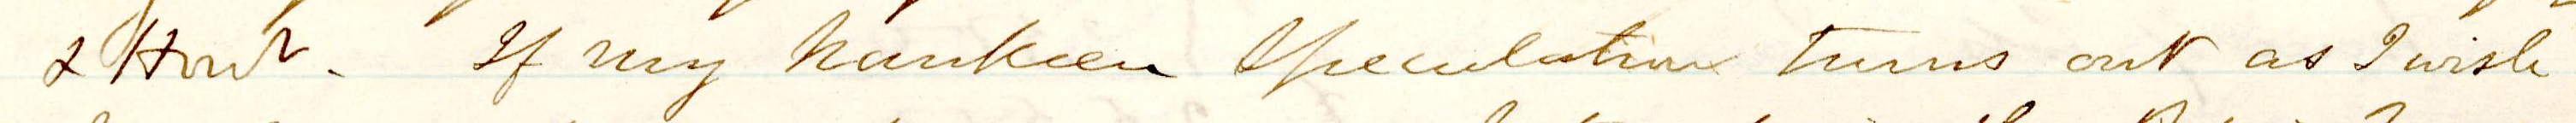& Hon^r.- If my Naukeen speculation turns out as I wish
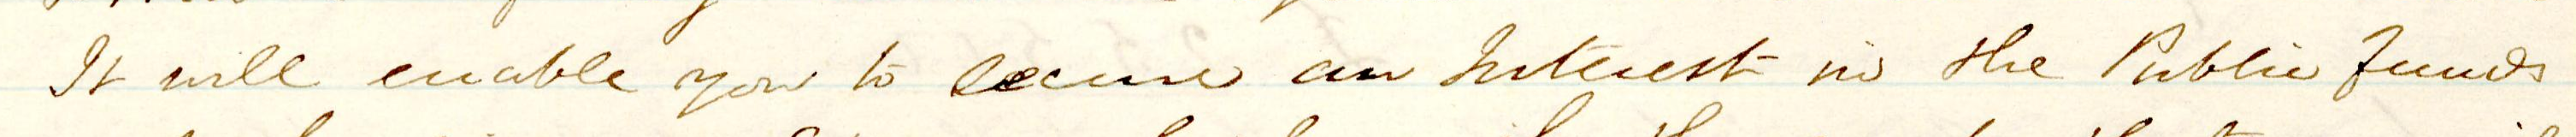It will enable you to secure an interest in the Public funds
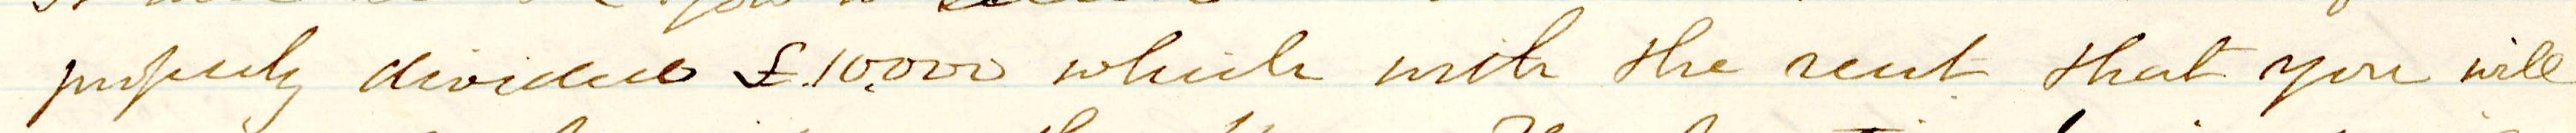properly divided £10,000 which with the rent that you will
